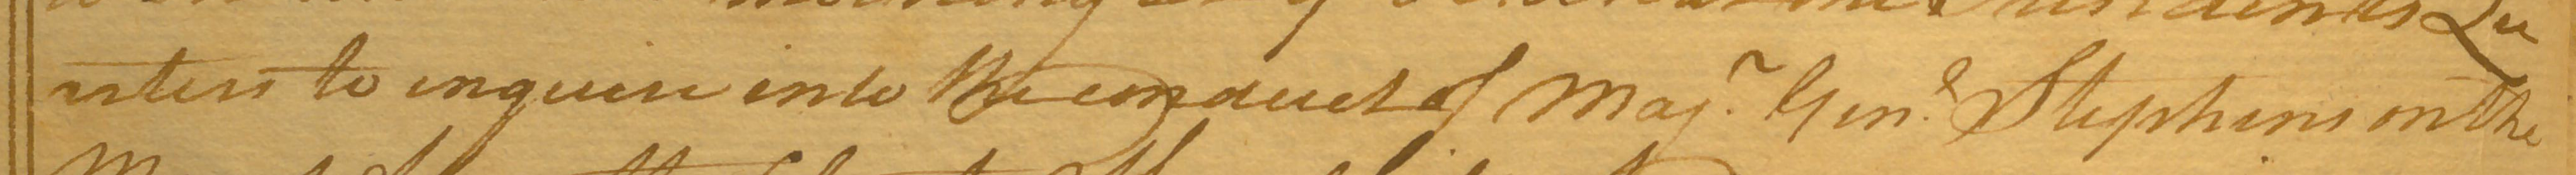arters to inquire into the conduct of Maj^r. Gen^l. Stephens in the
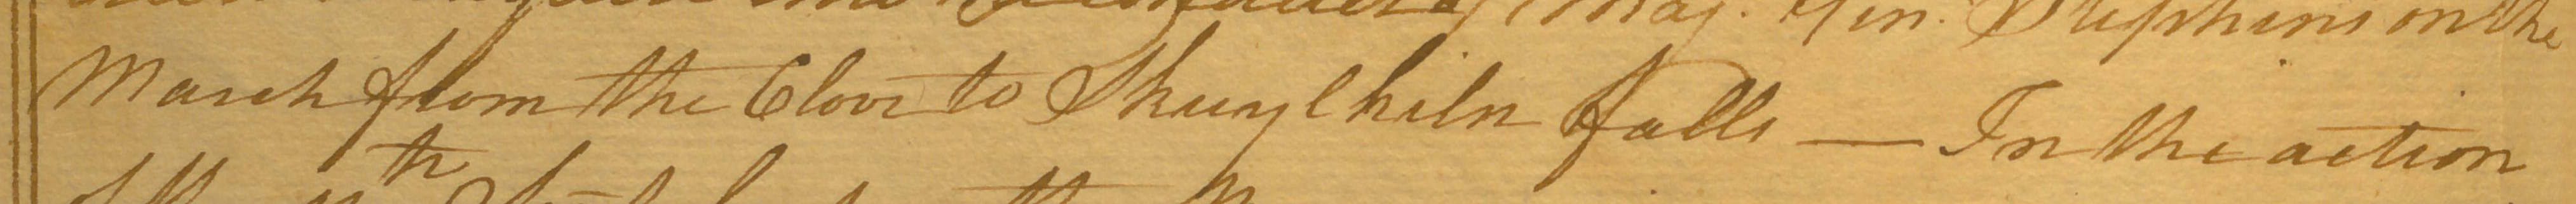March from the Clove to Skuylkill falls- For the action
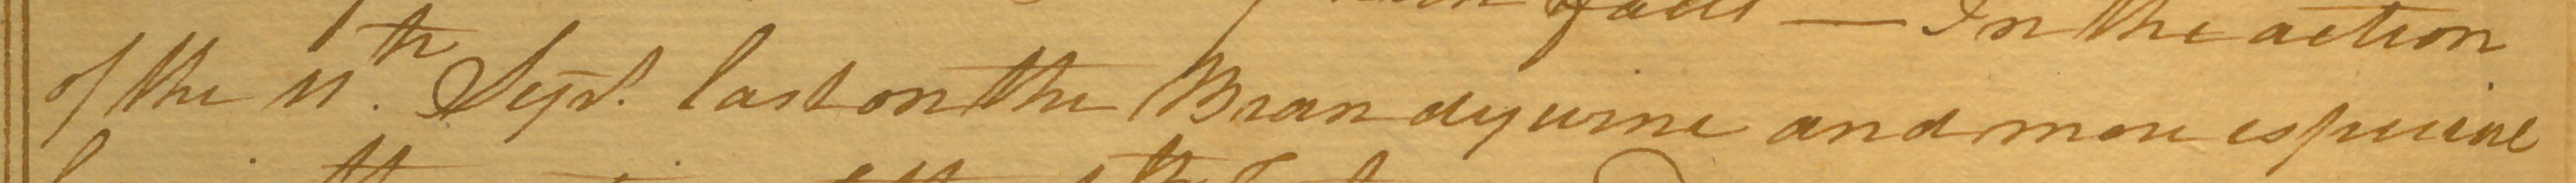of the 11^th. Sep^t. last on the Brandywine and more especial
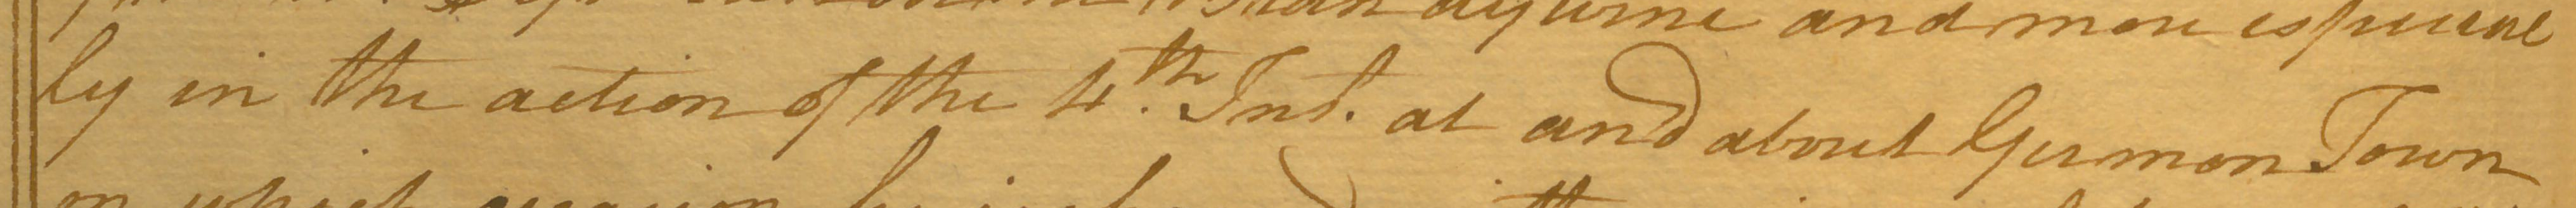ly in the action of the 4^th. Ins^t. at and about German Town
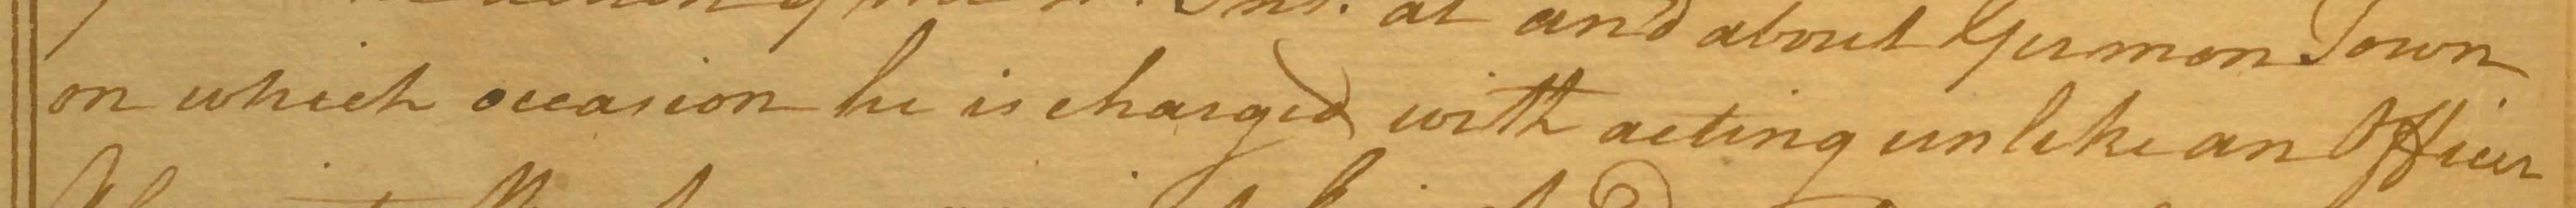on which occasion he is charged with acting unlike an Officer
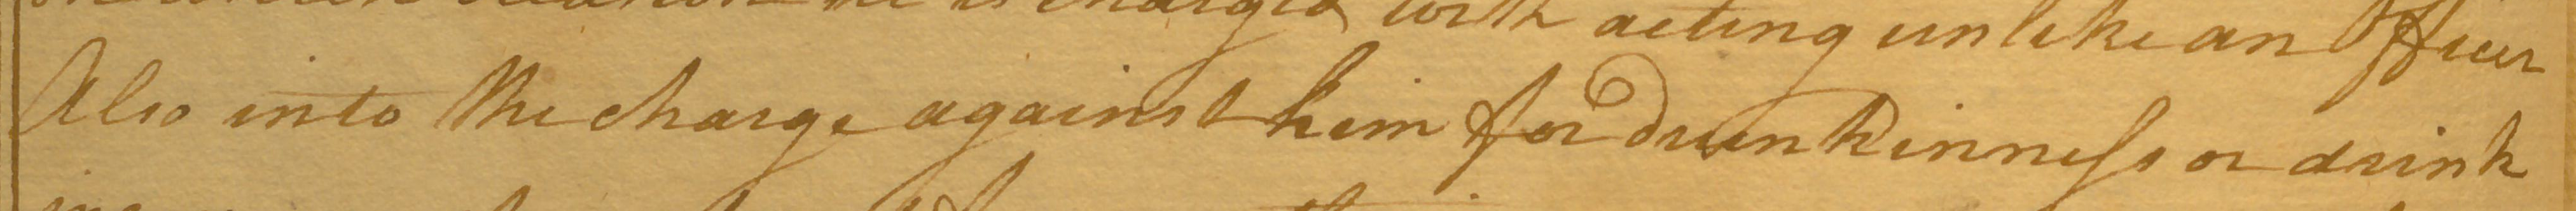Also into the charge against him for drunkinness or drink
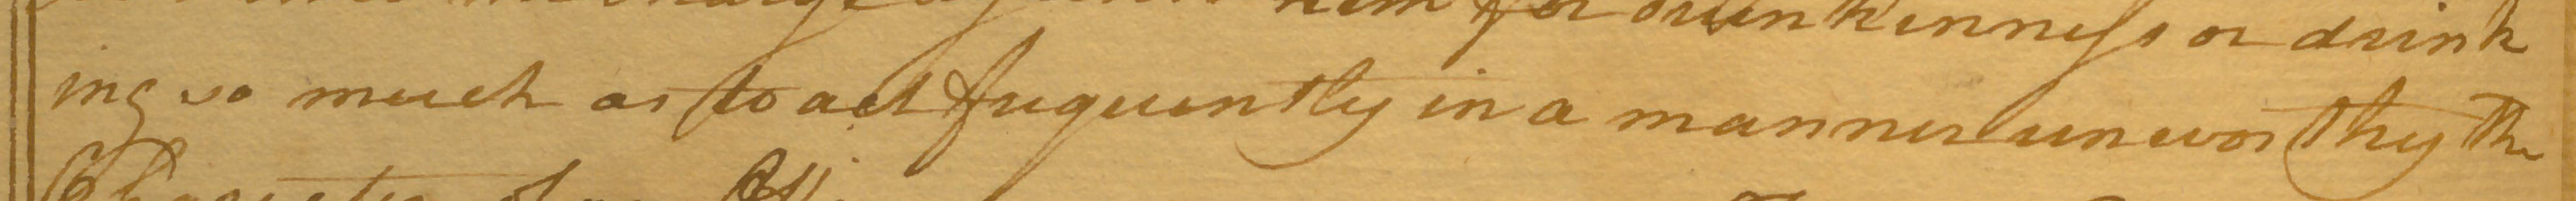ing so much as to act frequently in a manner unworthy the
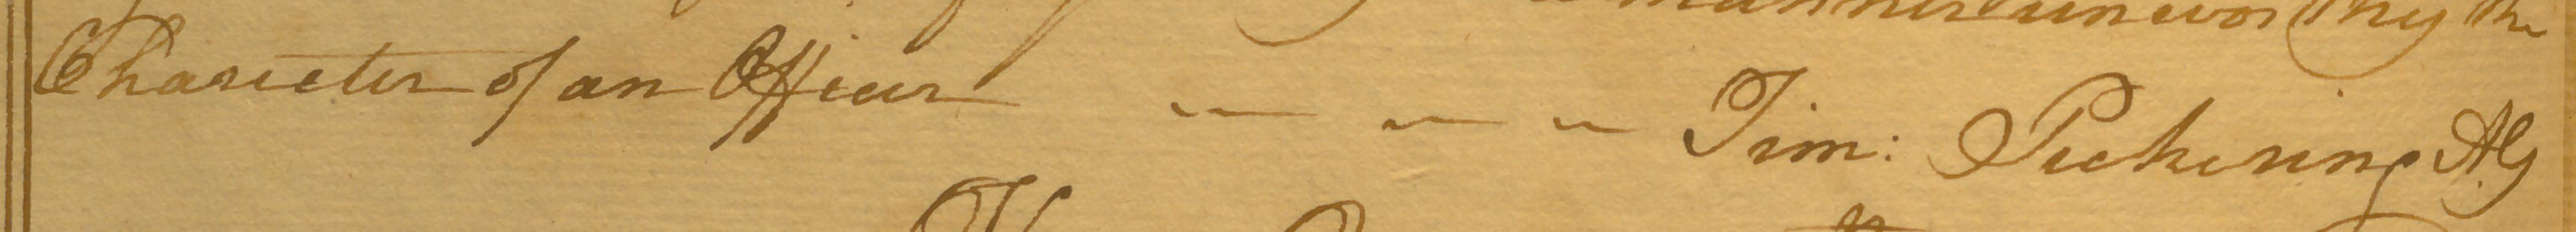Character of an Officer - - - Tim: Pickering AG
